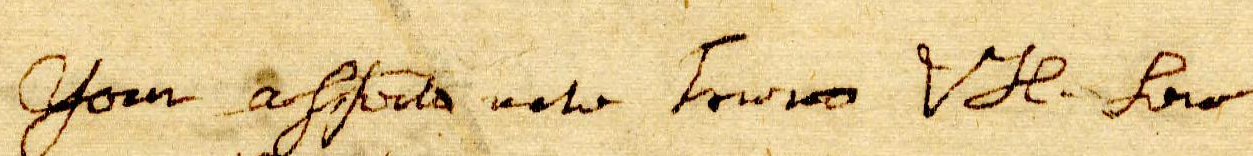Your affectionate Friend & H. Serv
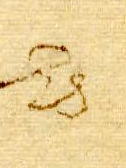ES
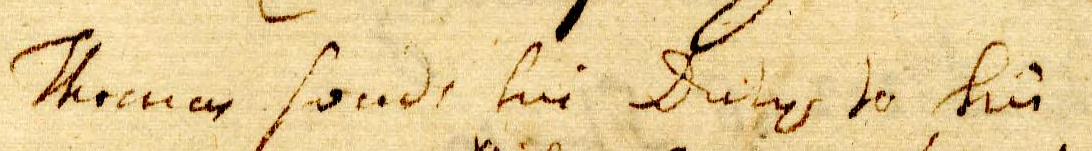Thomas sends his Duty to his
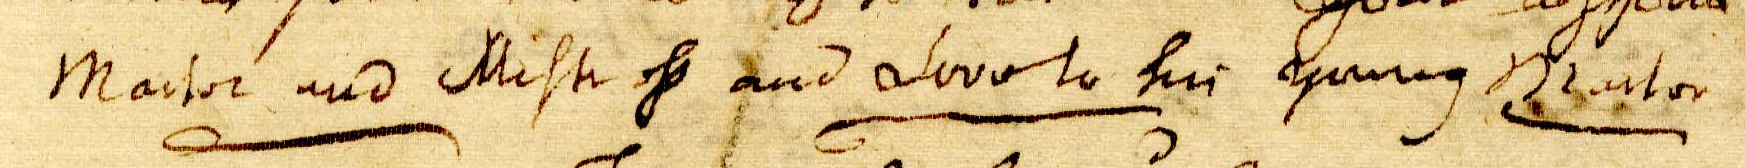Master and Mistress of and Love to his young Master
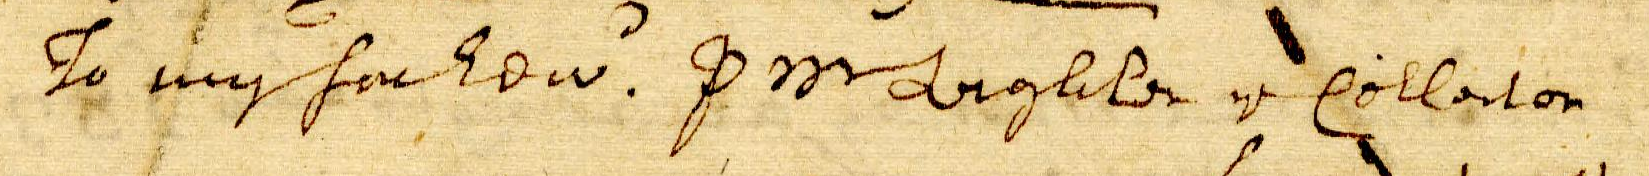To my Son Edw^d. per M^r Leighster y^e Collector
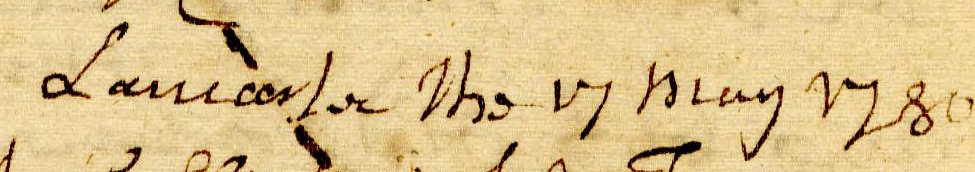Lancaster the 17 May 1780
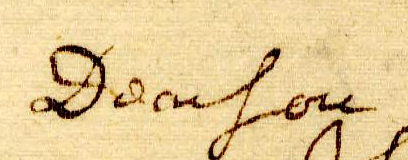Dear Son-
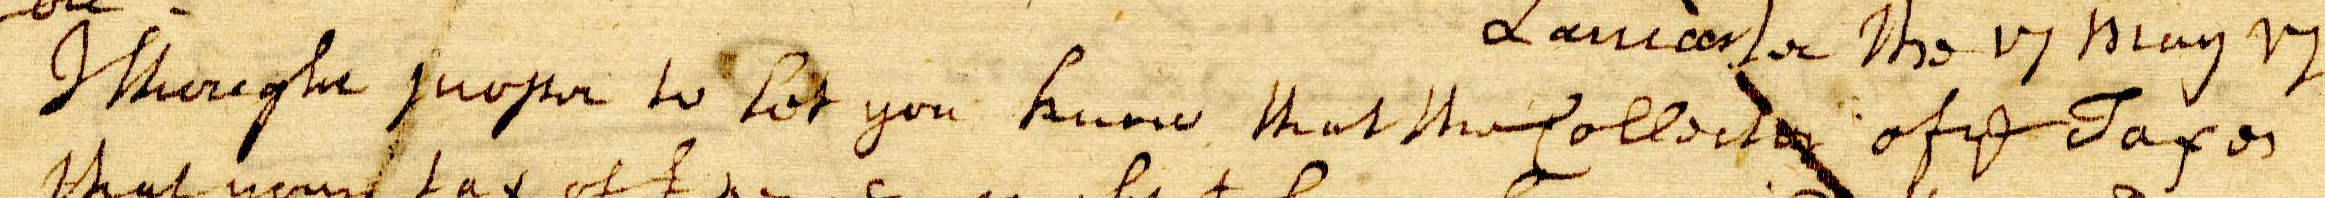I thought proper to let you know that the Collector of y^e Taxes
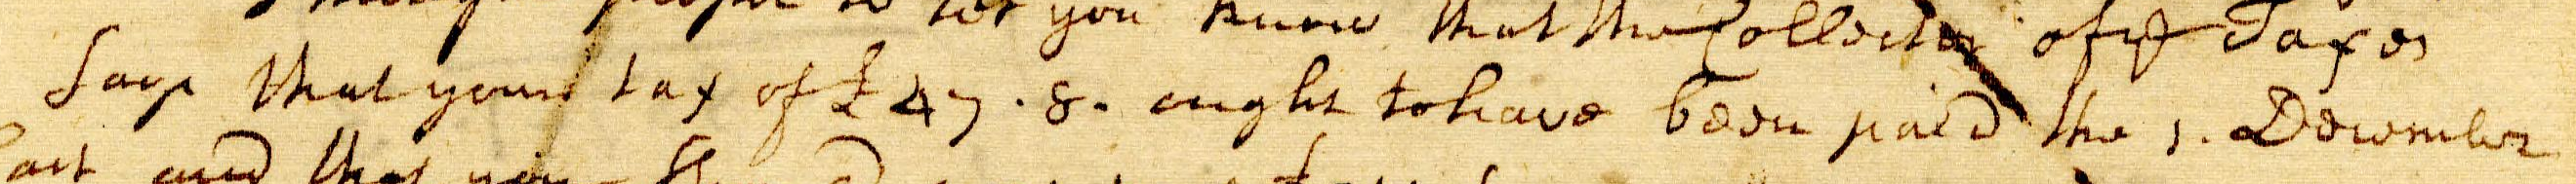{Save} that your tax of £47.8. ought to have been paid the 1. December
